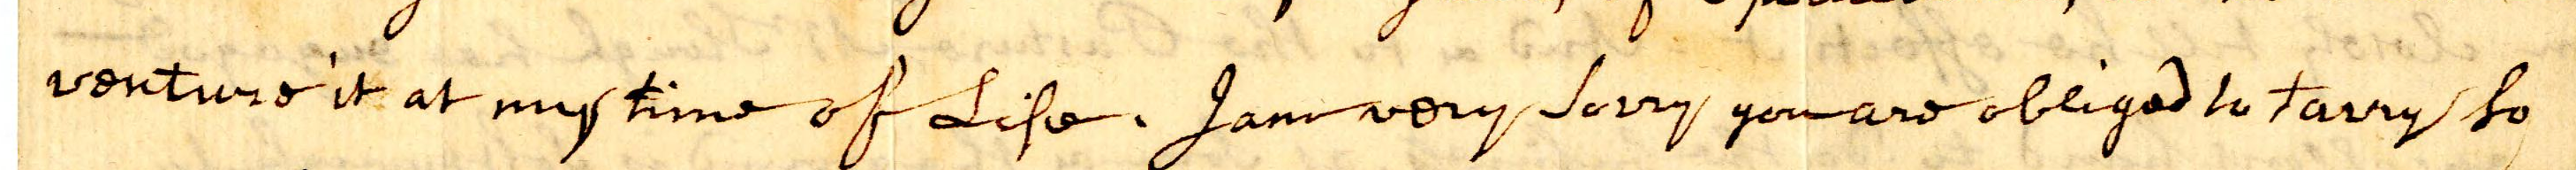venture it at my time of Life. I am very Sorry you are obliged to tarry so
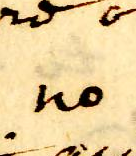no
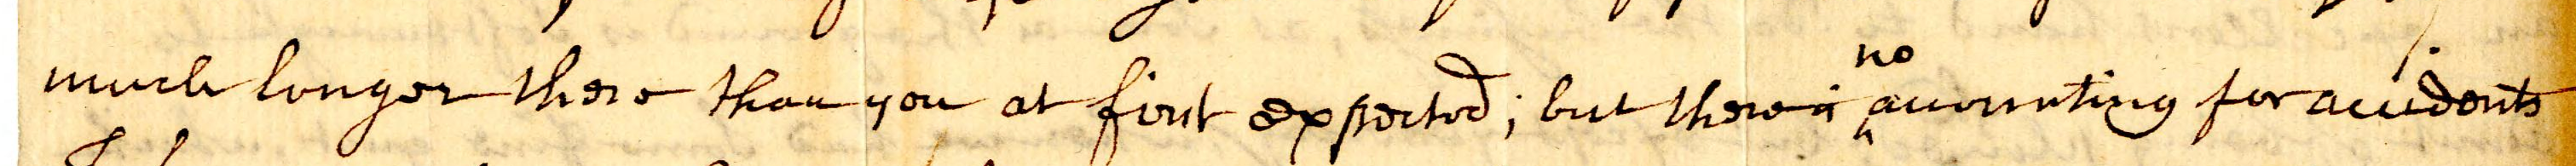much longer there than you at first expected; but there is ^ accounting for accidents
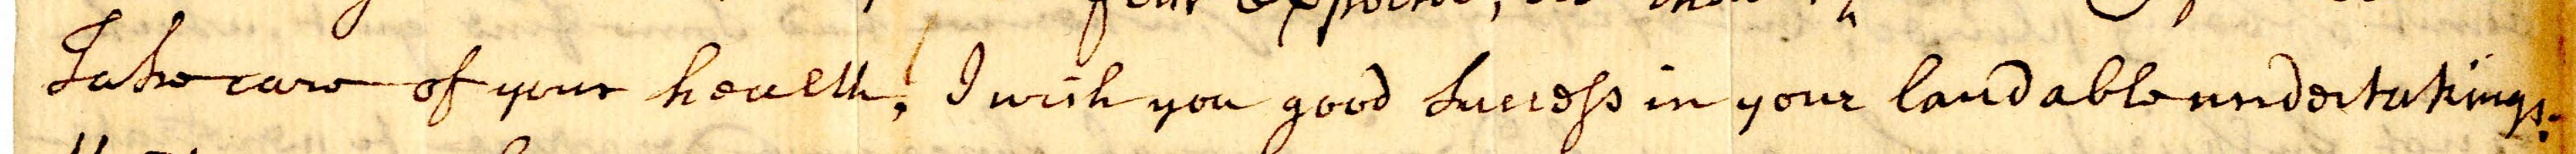Take care of your health. I wish you good Success in your laudable undertakings.
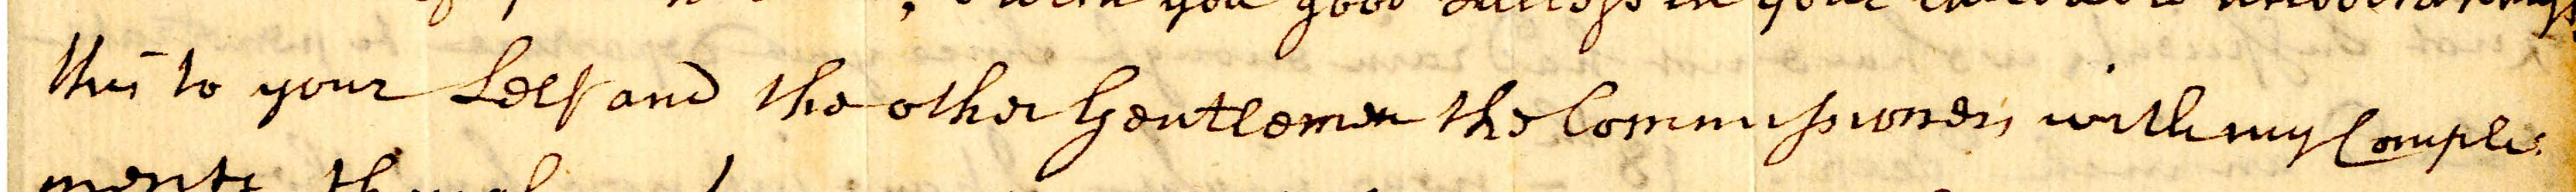this to your Self and the other Gentlemen the Commissioners with my Comple
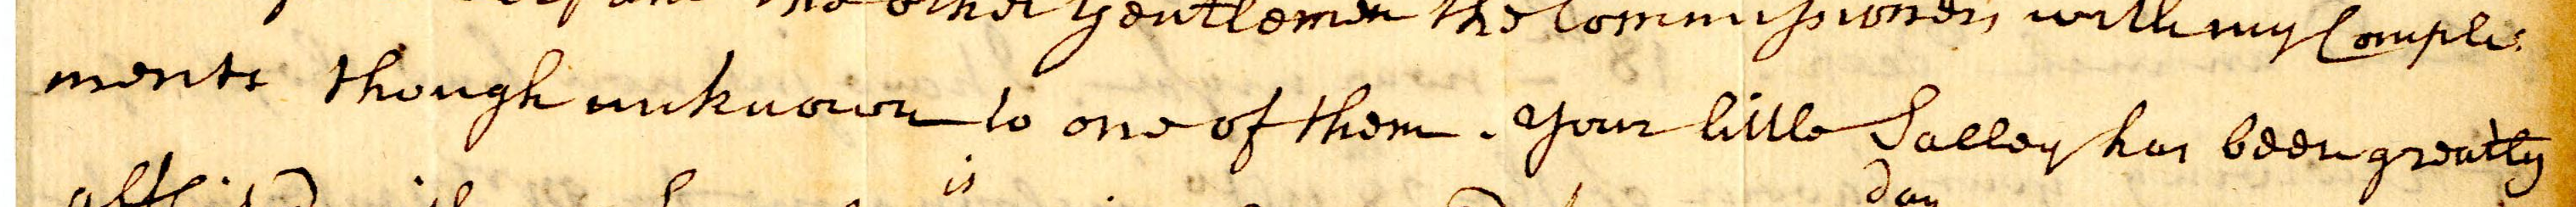ments though unknown to one of them. your little Salley has been greatly
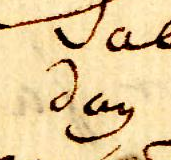day
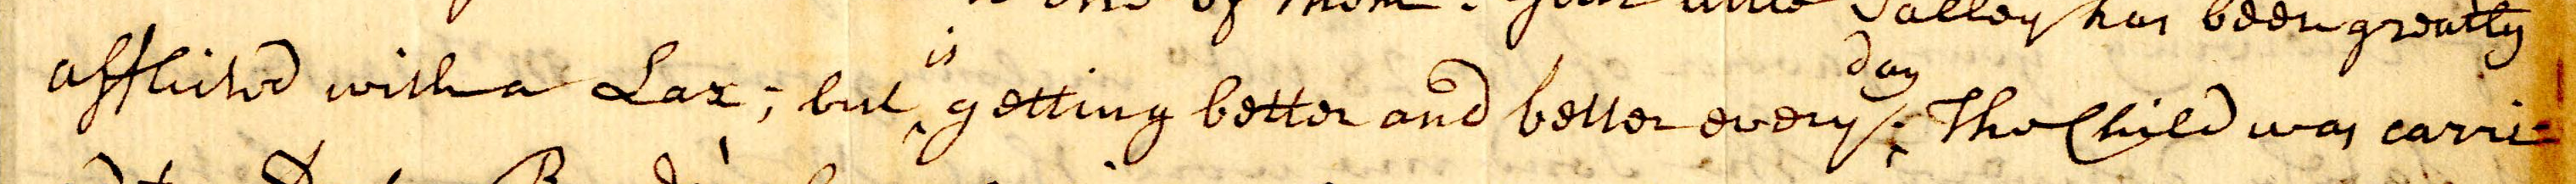Afflickd with a Lax; but getting better and better every ^ the Child was carre
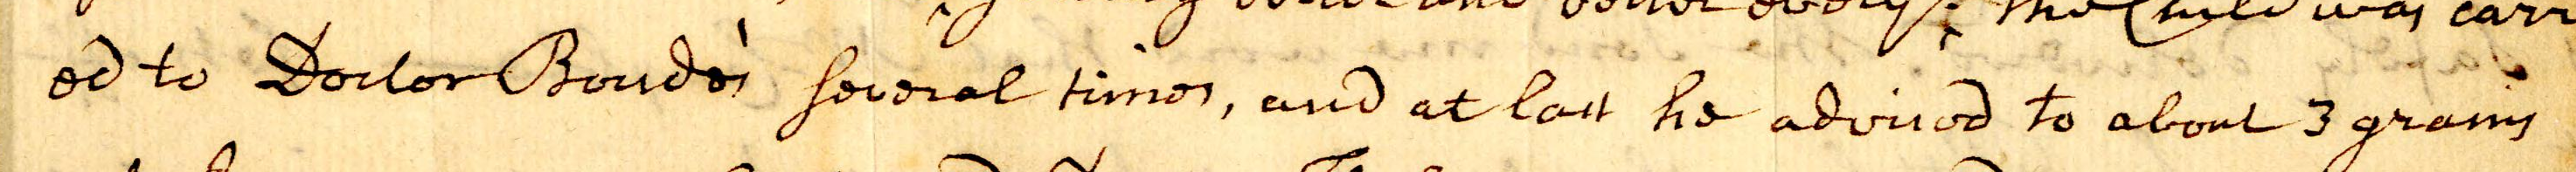ed to Doclor Boudos several times, and at last he advised to about 3 grams
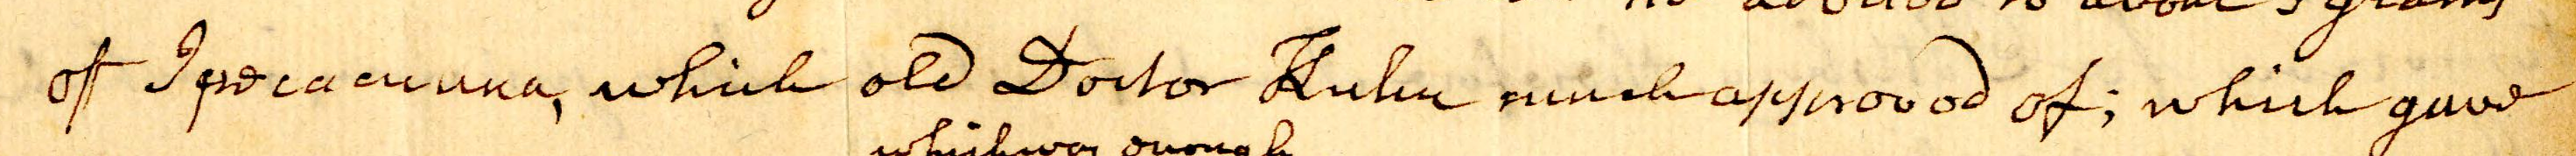of Ipocacunna, which old Doctor Kuhn much approved of; which gave
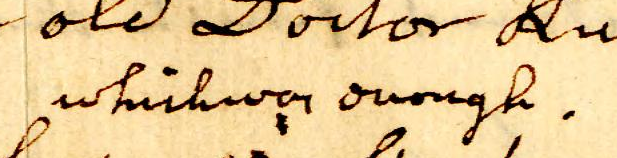which was enough
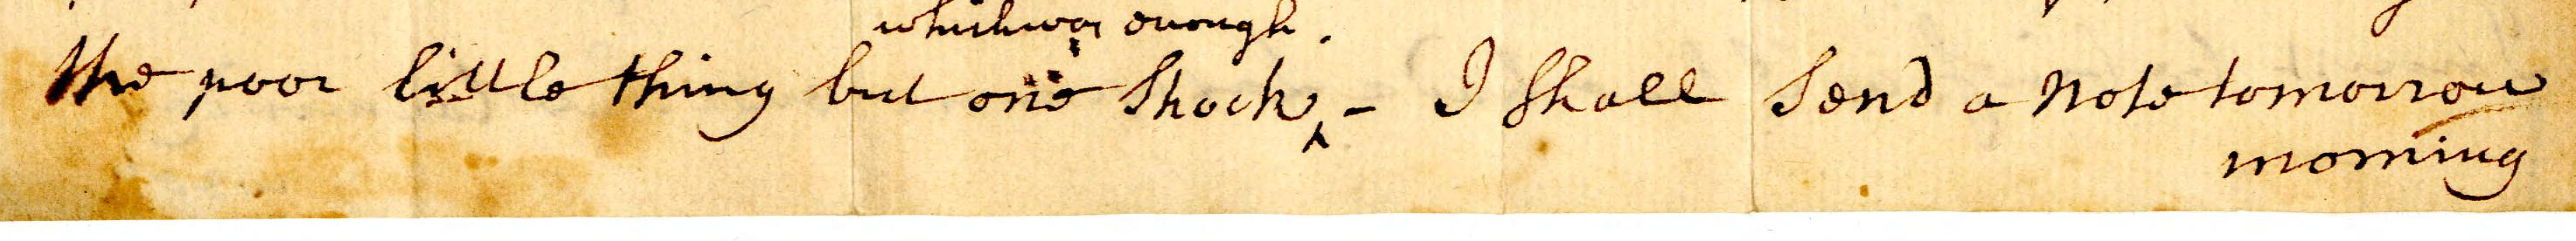the poor little thing but one Shock^- I shall Send a note tomorrow
